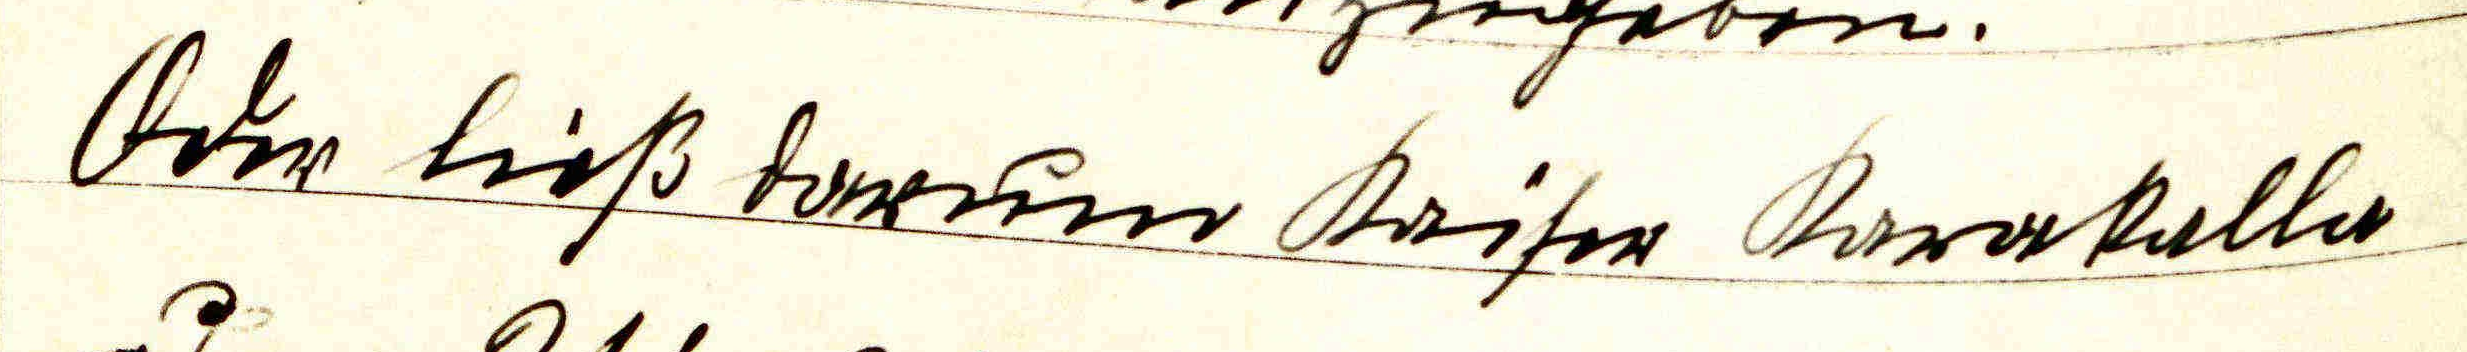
Oder ließ darum Kaiser Karakalla
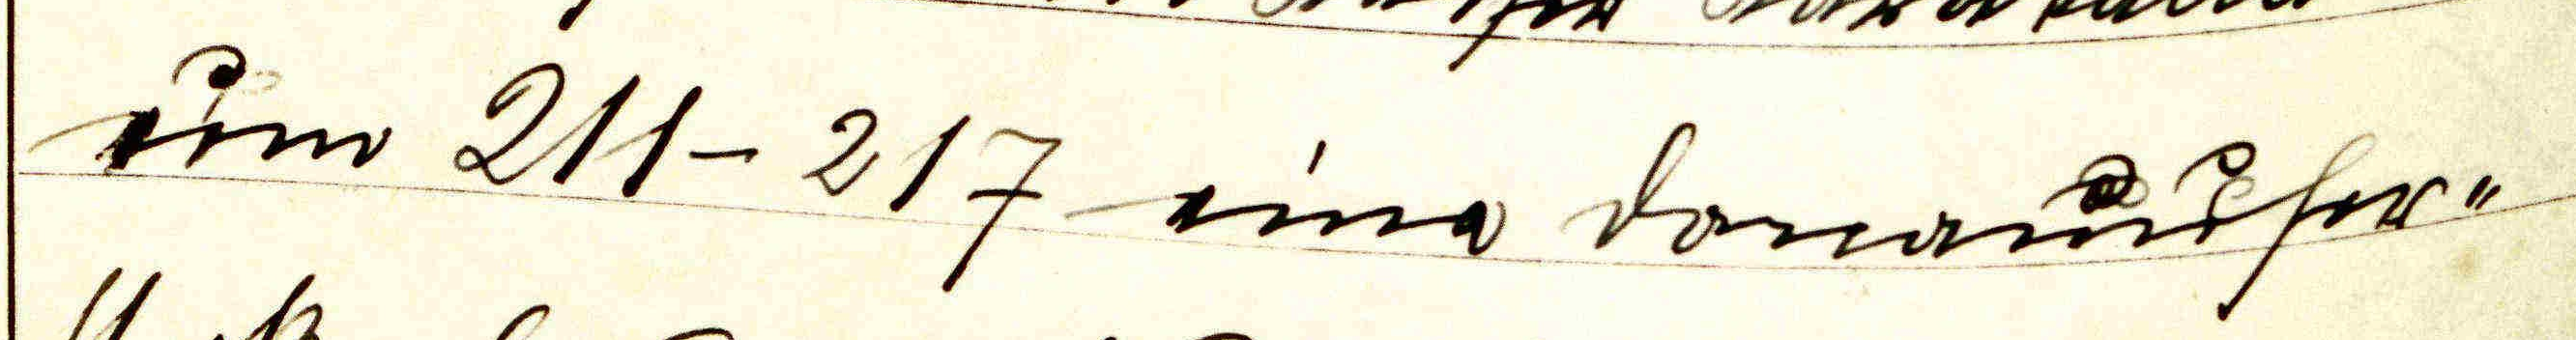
um 211-217 eine Donauufer-
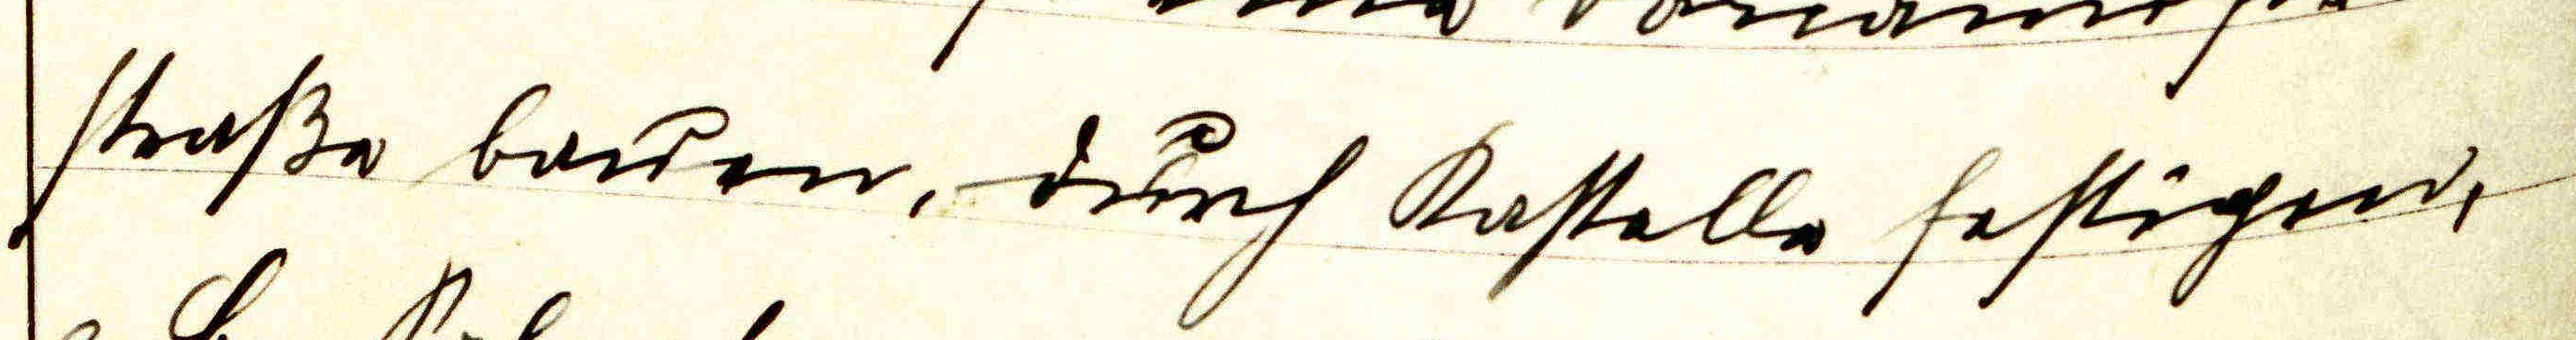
straße bauen, durch Kastelle festigen.
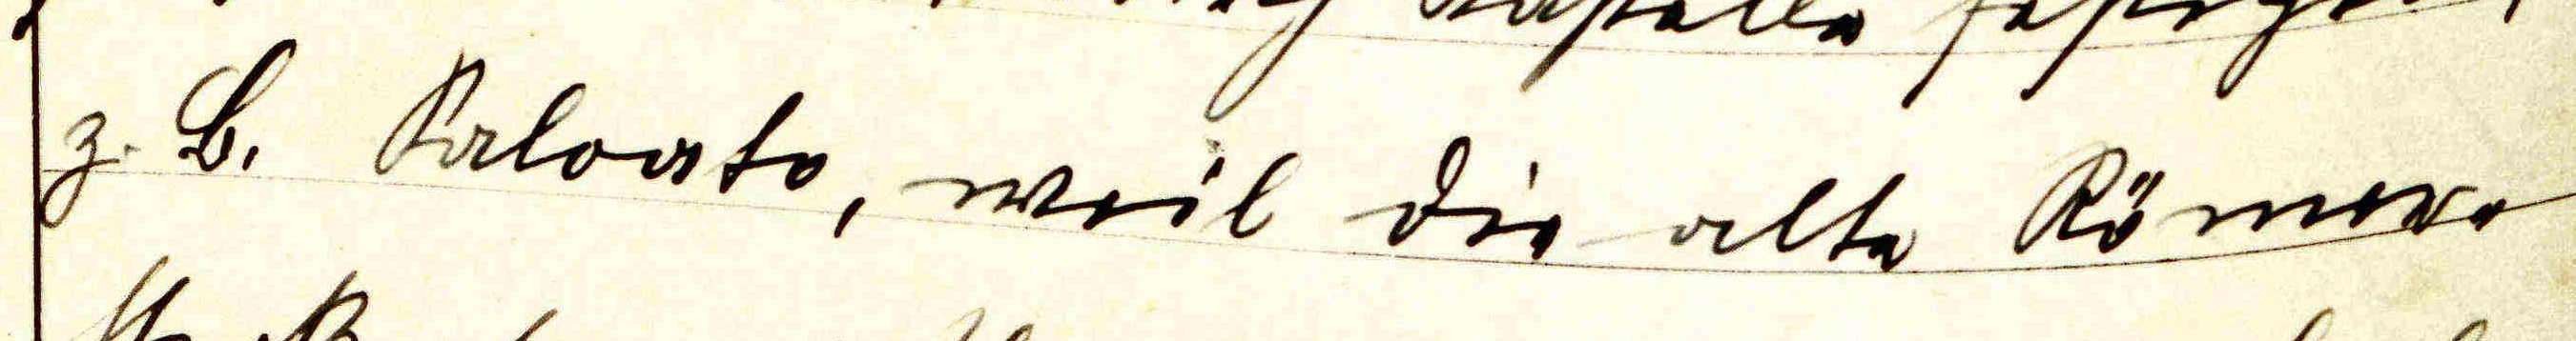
z.B. Saloato, weil die alte Römer-
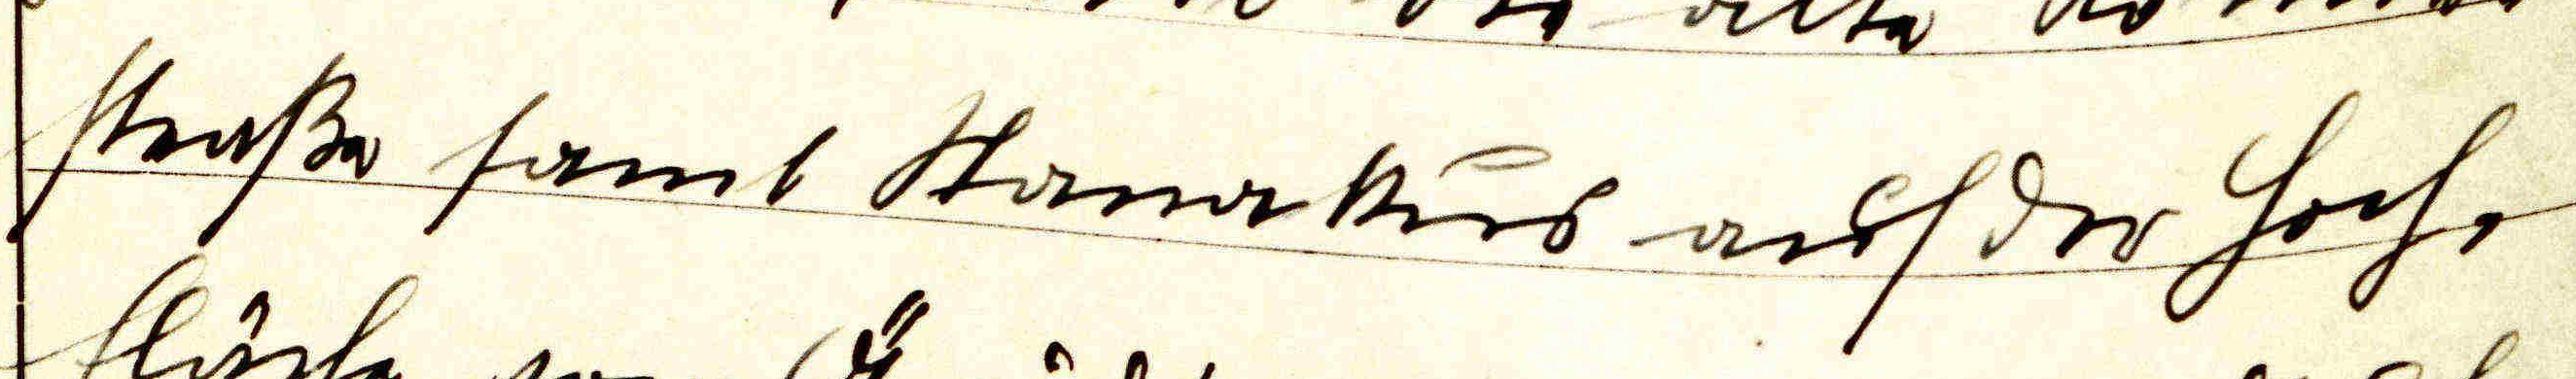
straße samt Stanakus auf der Hoch-
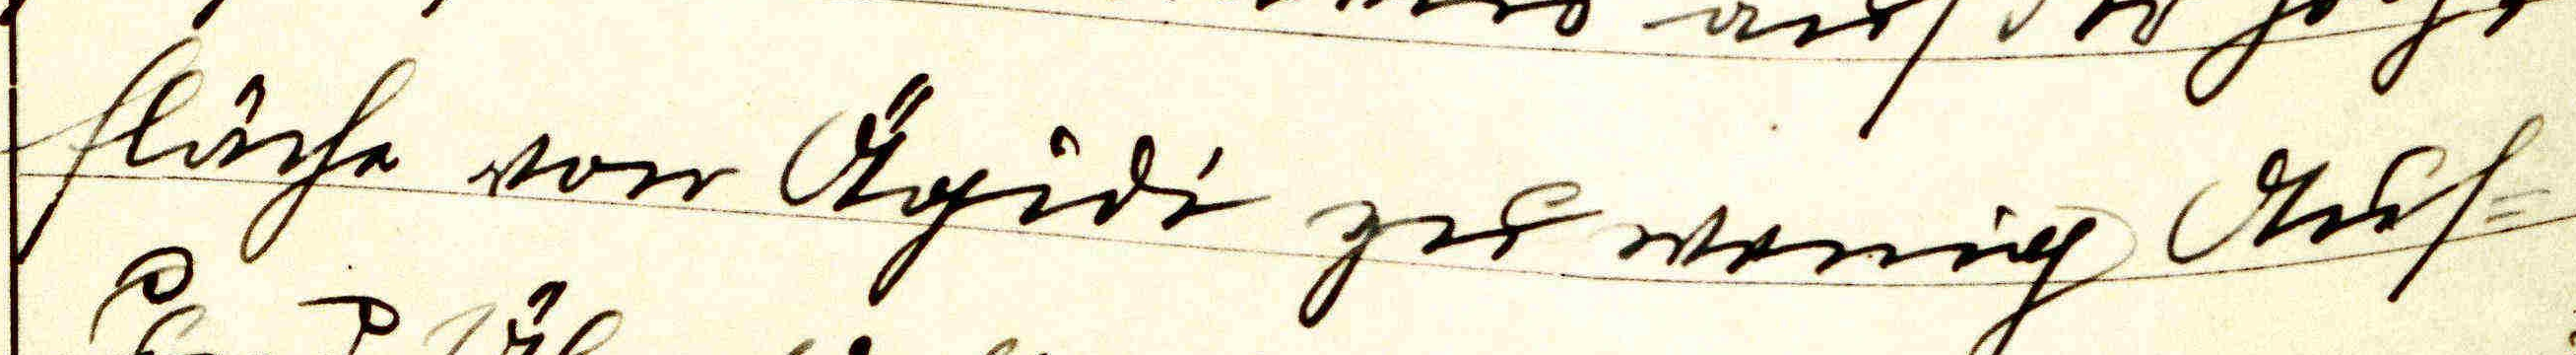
fläche von Ägidi zu wenig Auf-
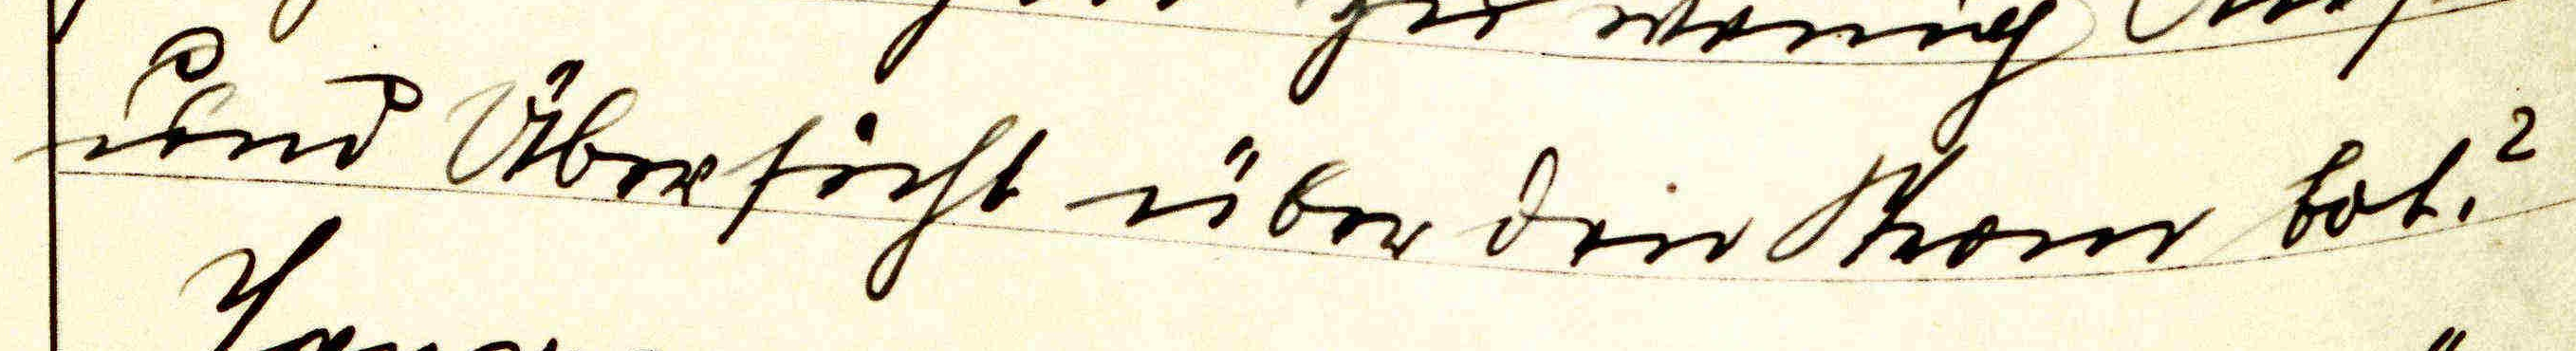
und Übersicht über den Strom bot?
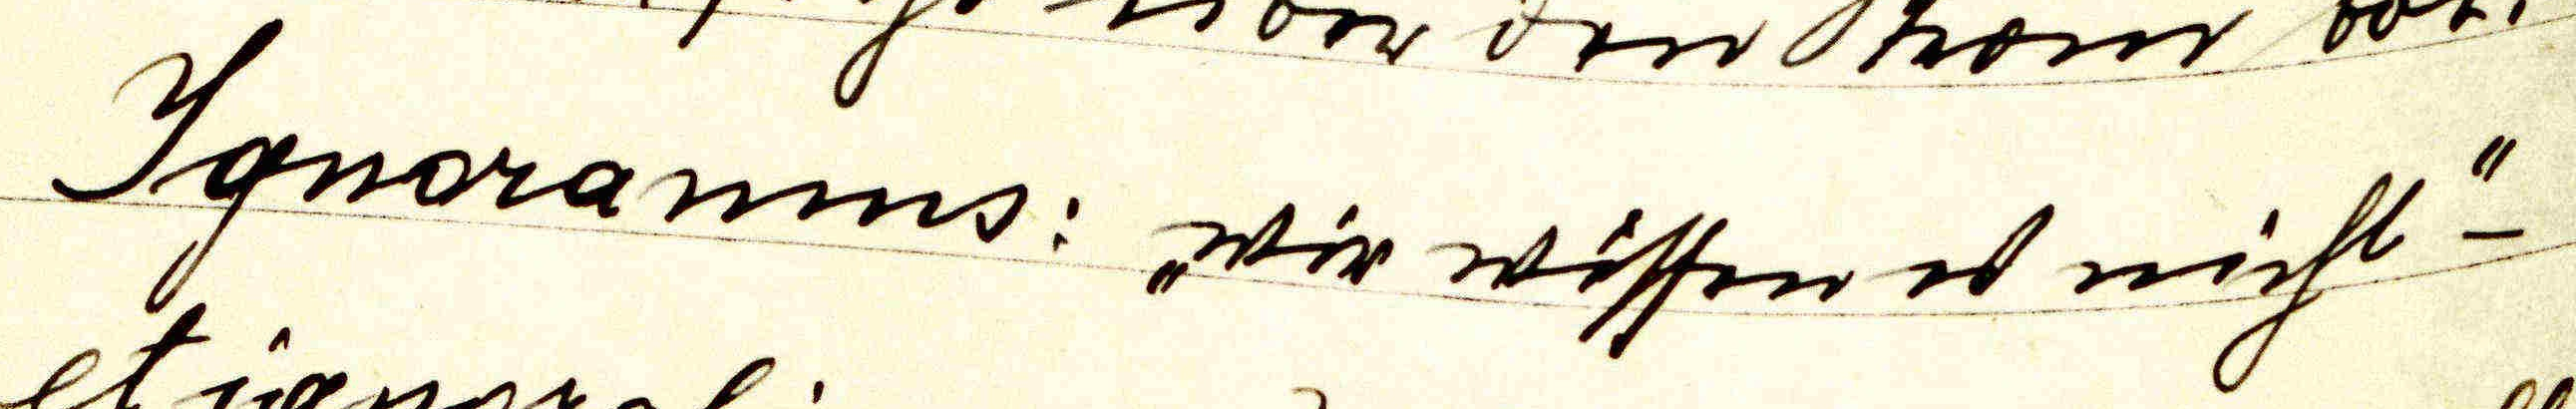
Ignoramus: „wir wissen es nicht“-
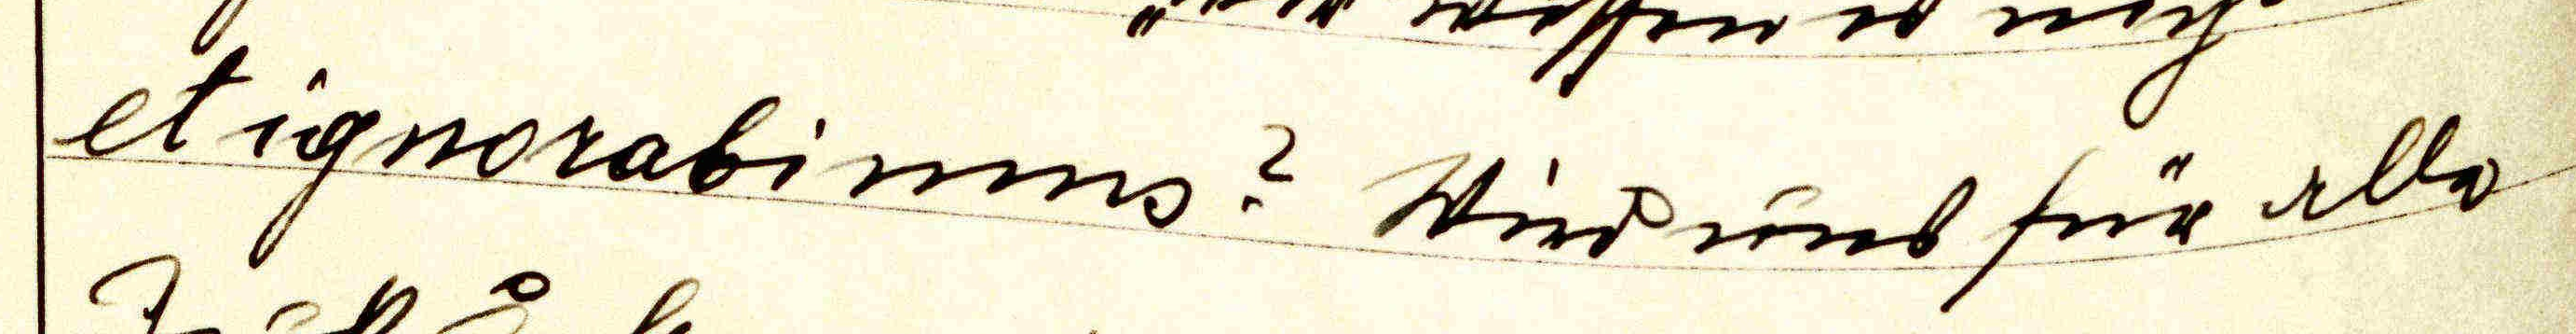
et ignorabimus? Wird uns für alle
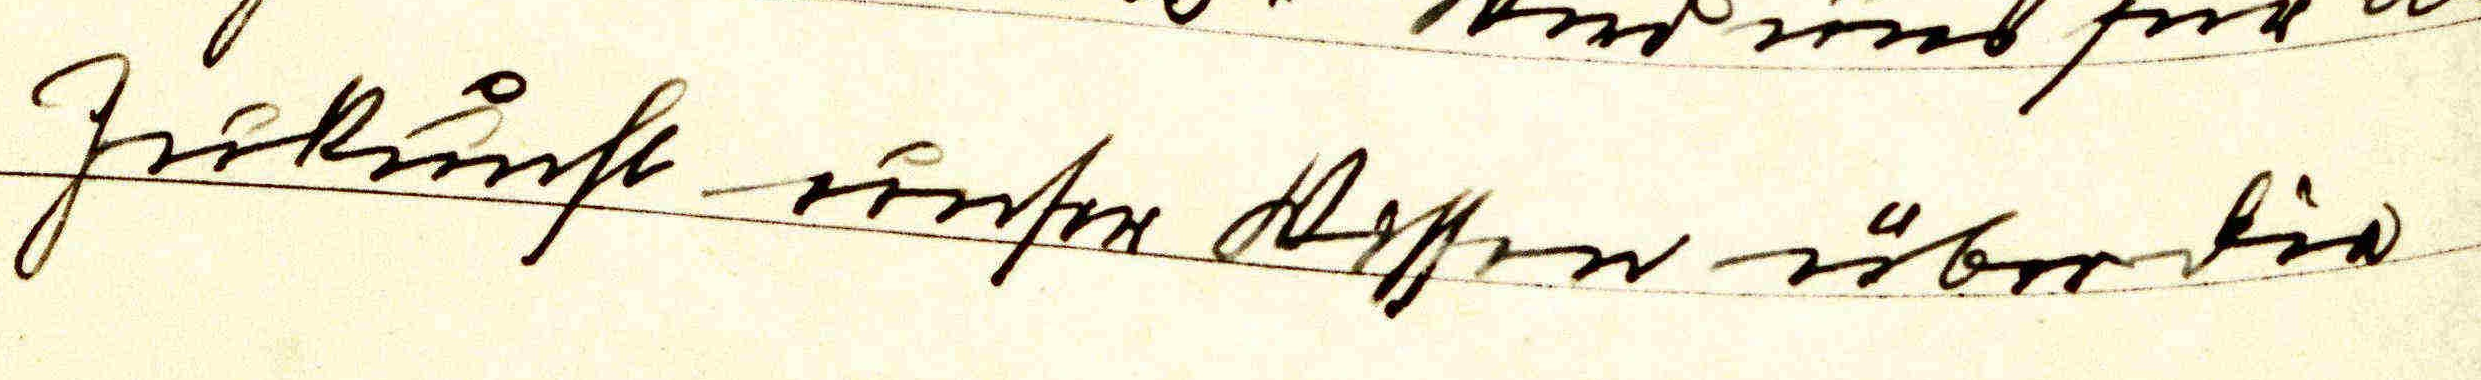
Zukunft unser Wissen über die
